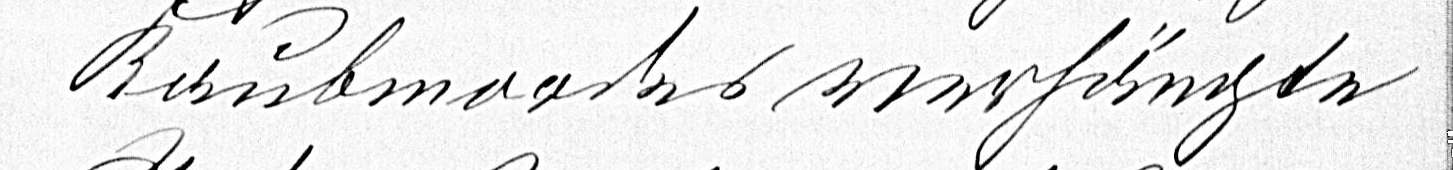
Raubmordes verhängte
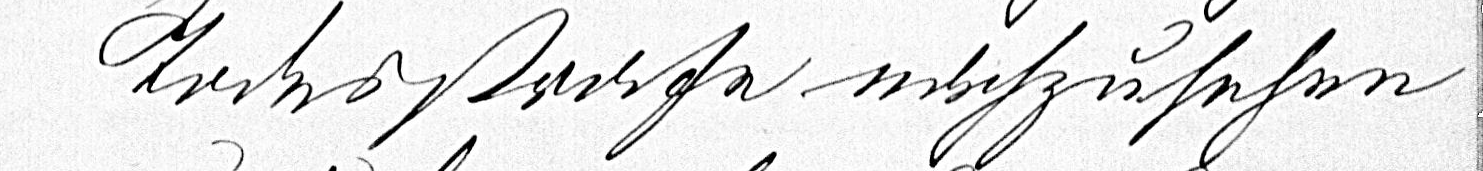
Todesstrafe nachzusehen
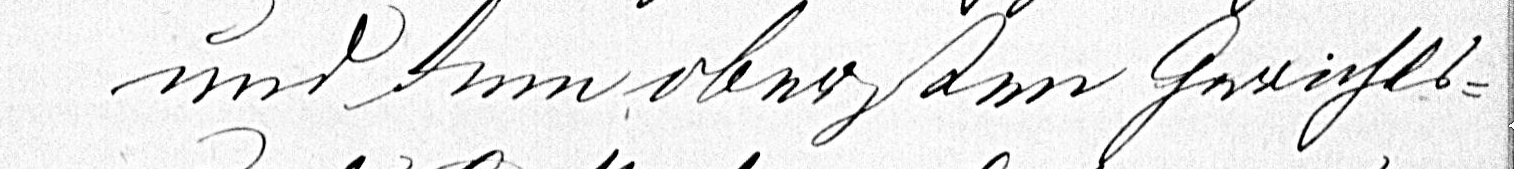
und dem obersten Gerichts-
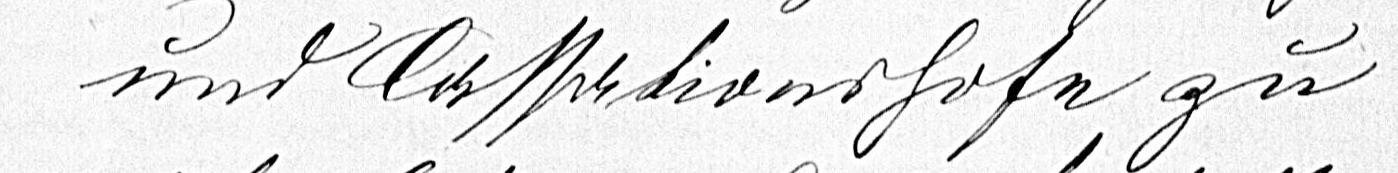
und Cassationshofe zu
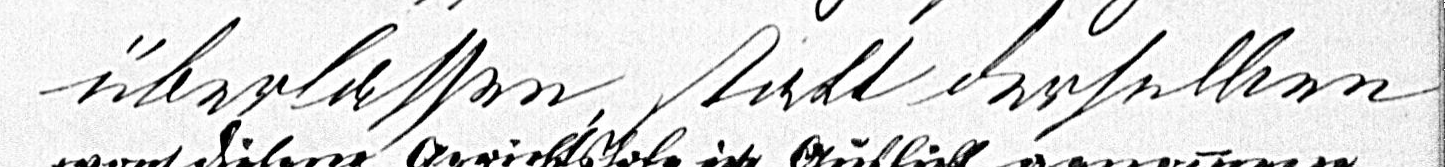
überlassen statt derselben
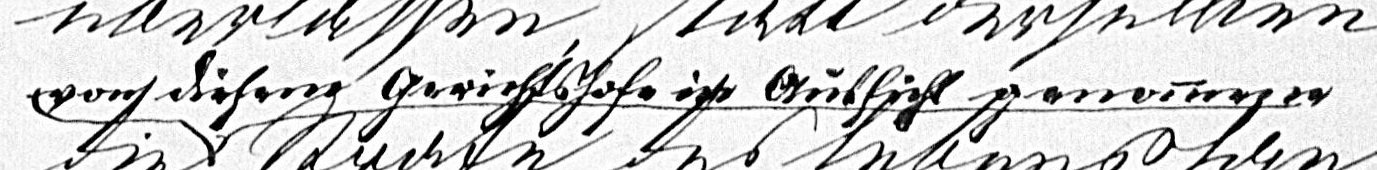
von diesem Gerichtshofe ist Aussicht genommene
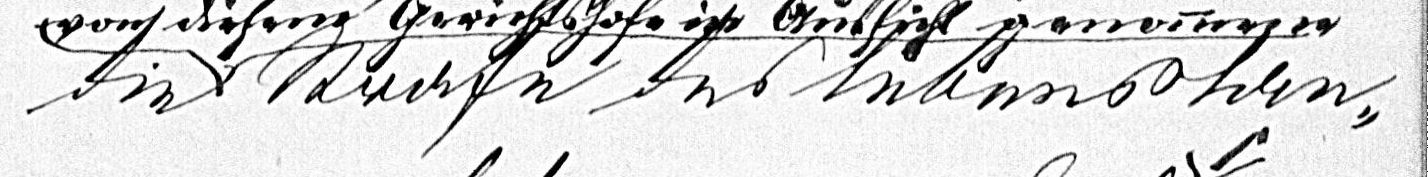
die die Strafe des lebenslan¬
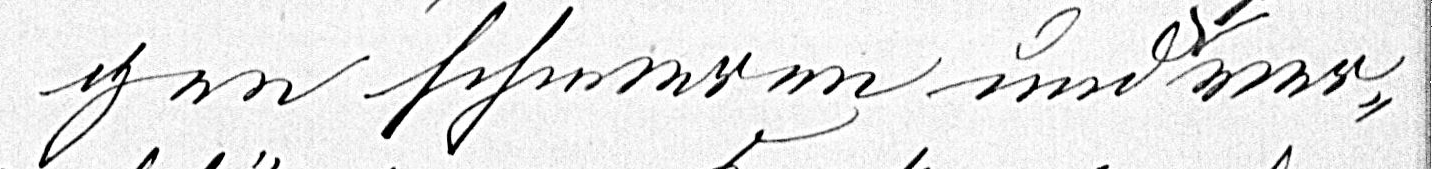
gen schweren und ver¬
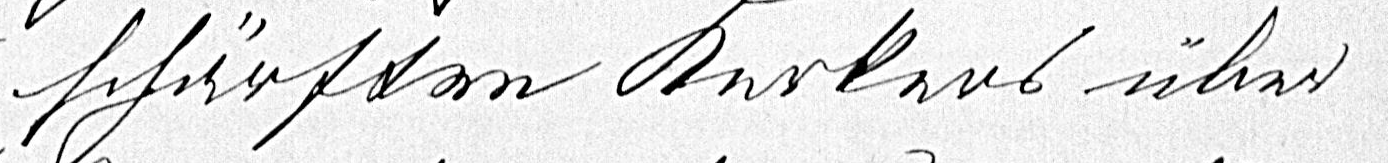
schärften Kerkers über
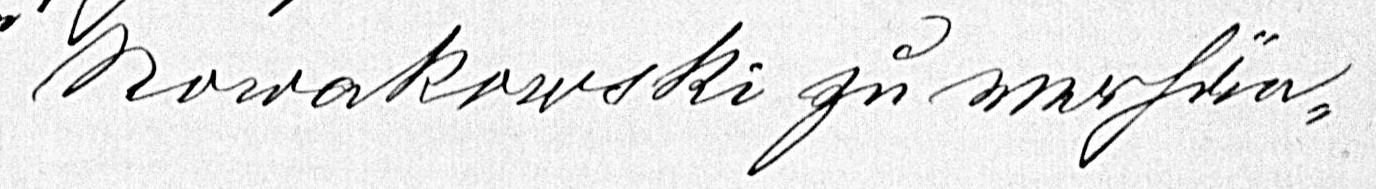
Nowakowski zu verhän¬
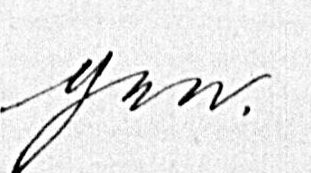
gen.
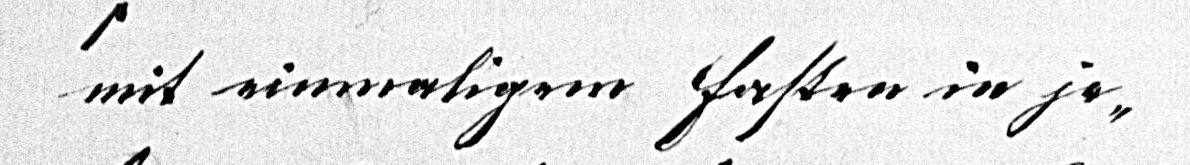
mit einmaligem Fasten in je¬
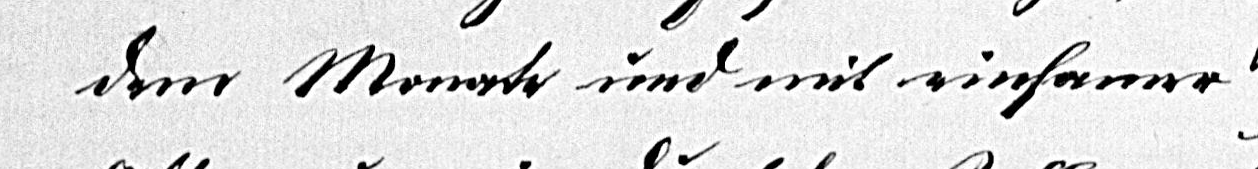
dem Monate und mit einhaner
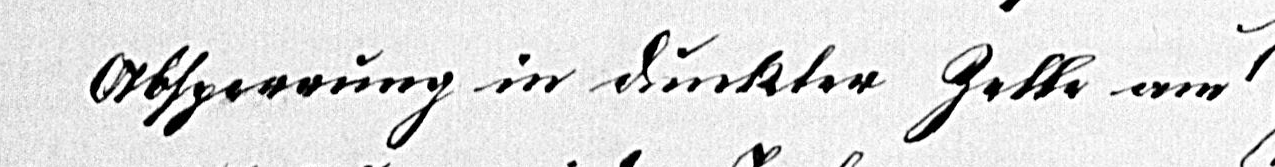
Absperrung in dunkter Zelle am
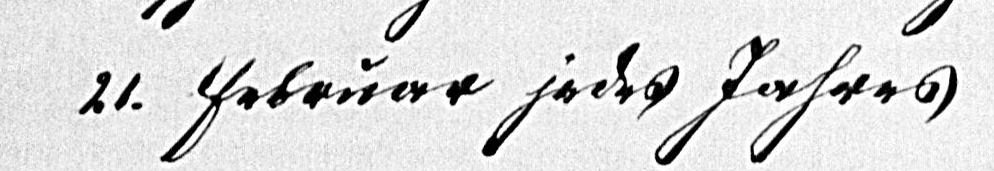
21. Februar jedes Jahres
